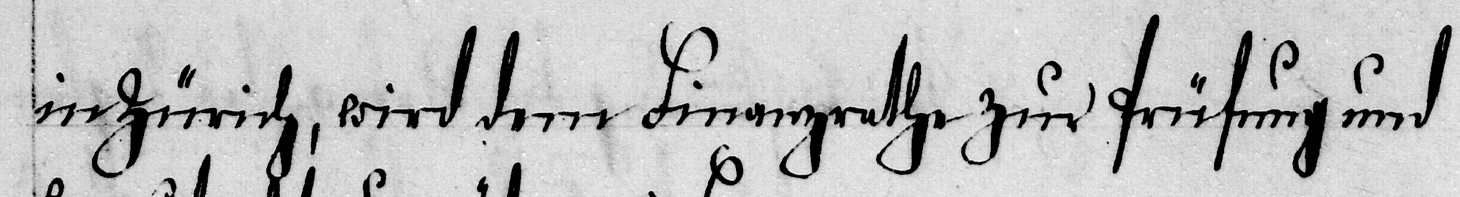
in Zürich, wird dem Finanzrathe zur Prüfung und
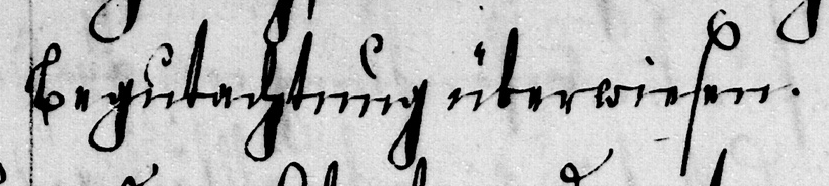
Begutachtung überwiesen.
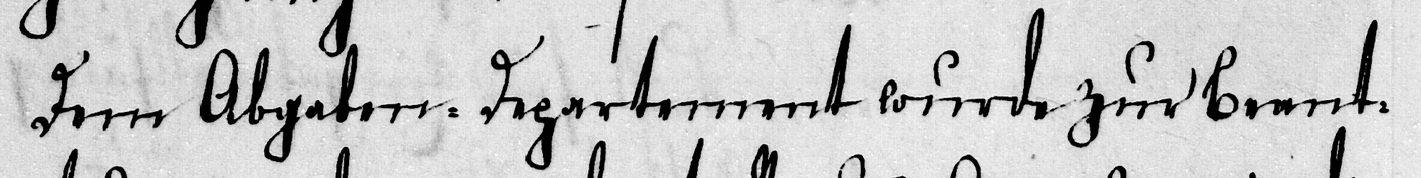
Dem Abgaben-Departement wurde zur Beant¬
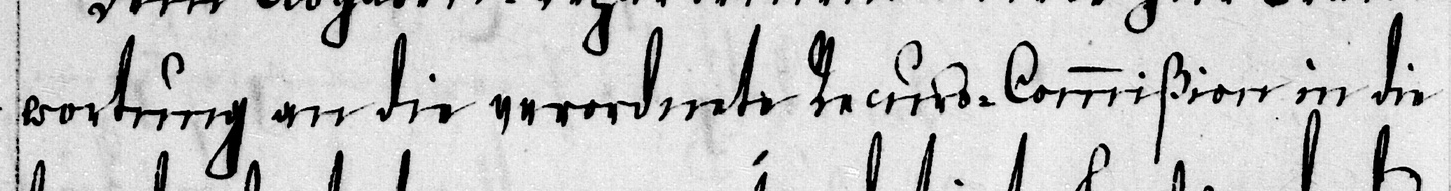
wortung an die verordnete Recurs-Commißion in die
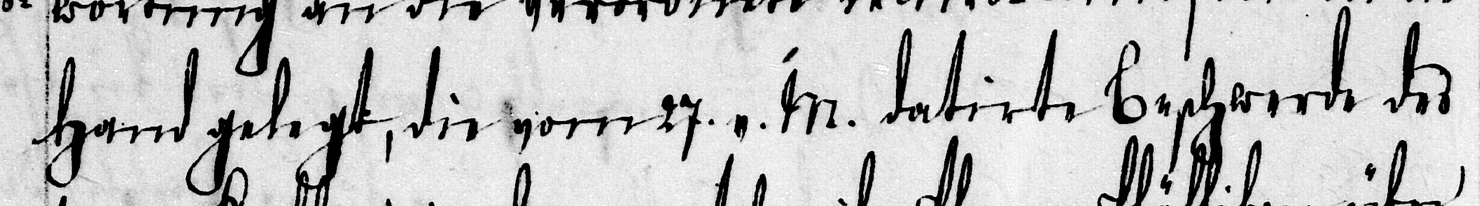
Hand gelegt, die vom 27. v. M. datirte Beschwerde des
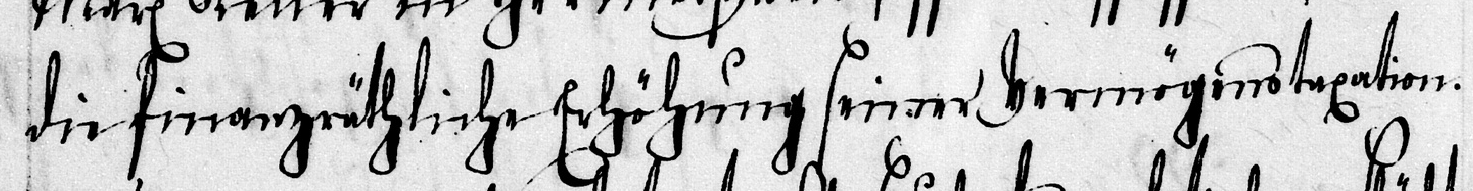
die finanzräthliche Erhöhung seiner Vermögenstaxation.
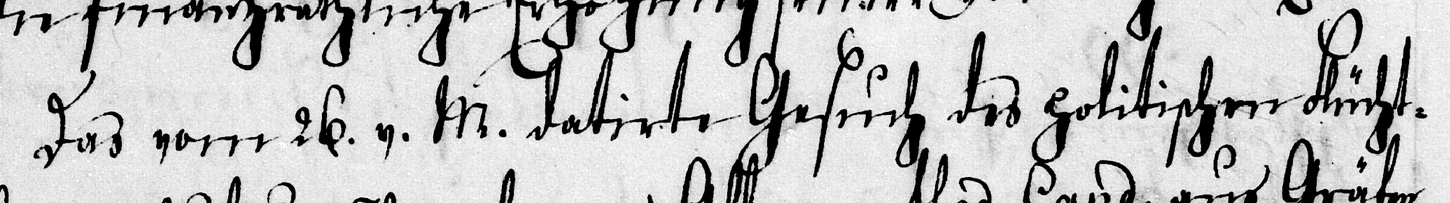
Das vom 26. v. M. datirte Gesuch des politischen Flüch¬
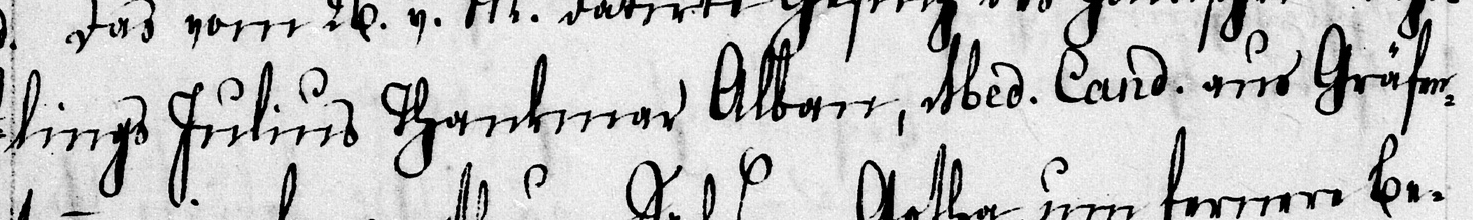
tlings Julius Thankmar Alban, Med. Cand. aus Gräfen¬
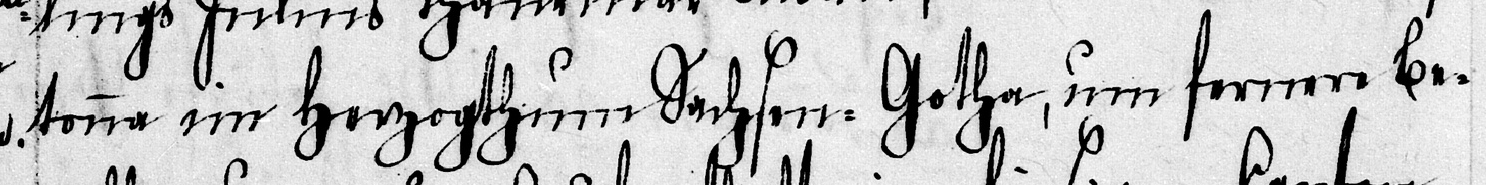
tonna im Herzogthum Sachsen-Gotha, um fernere Be¬
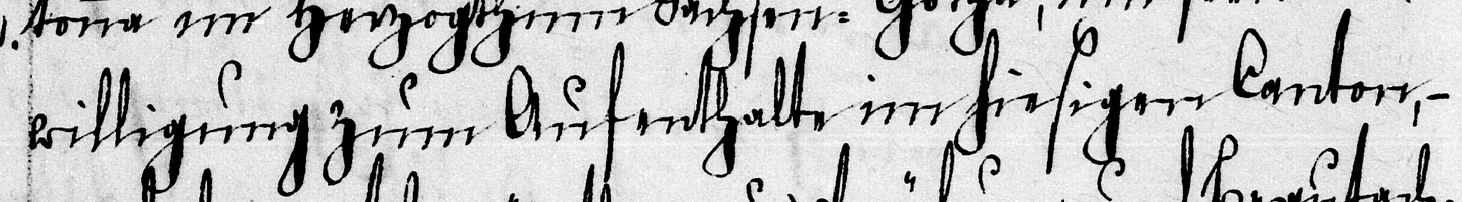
willigung zum Aufenthalte im hiesigen Canton,
